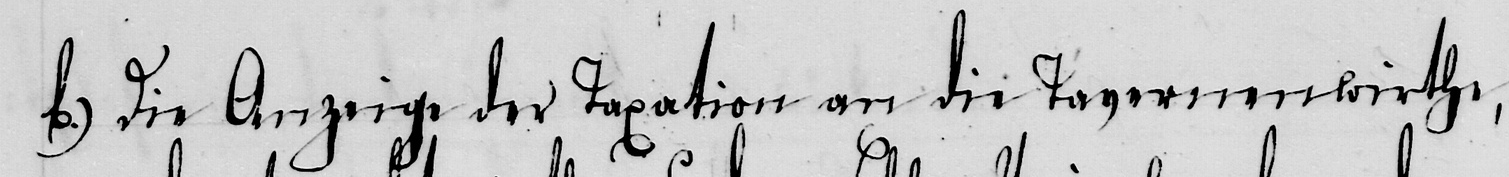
b.) Die Anzeige der Taxation an die Tavernenwirthe,
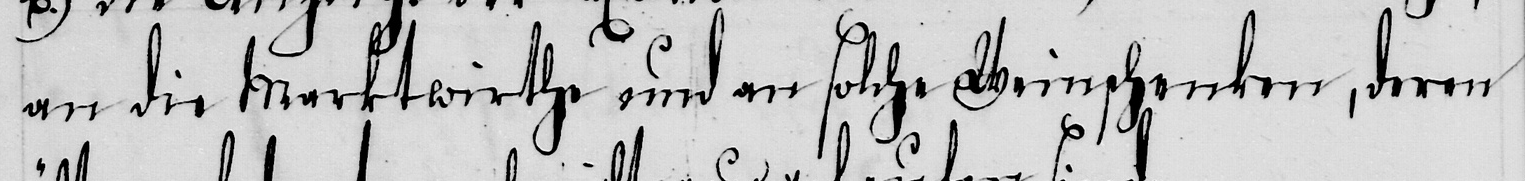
an die Marktwirthe und an solche Weinschenken, deren
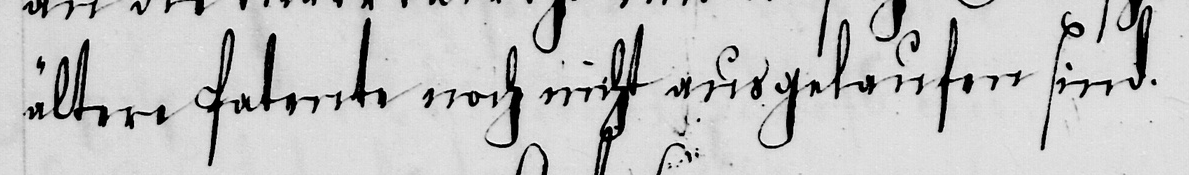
ältere Patente noch nicht ausgelaufen sind.
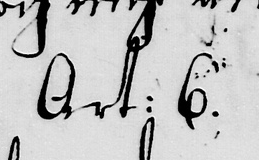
Art: 6.
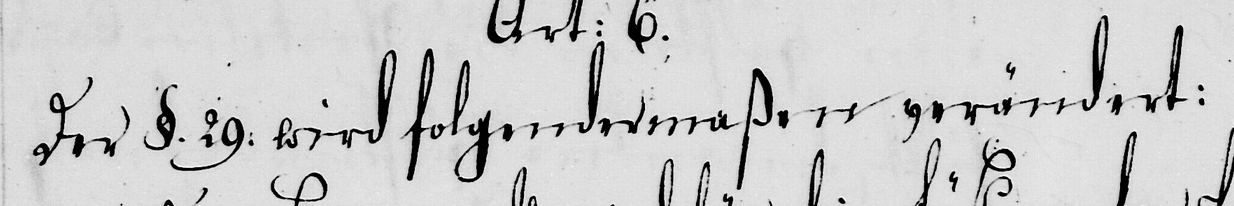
Der §. 29. wird folgendermaßen verändert:
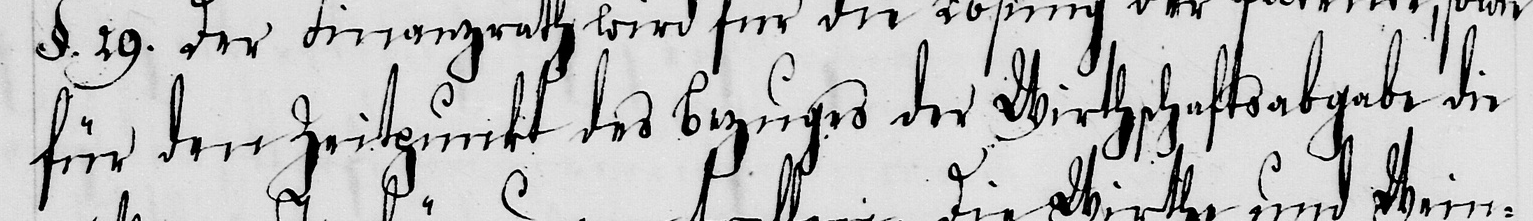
für den Zeitpunkt des Bezuges der Wirthschaftsabgabe die
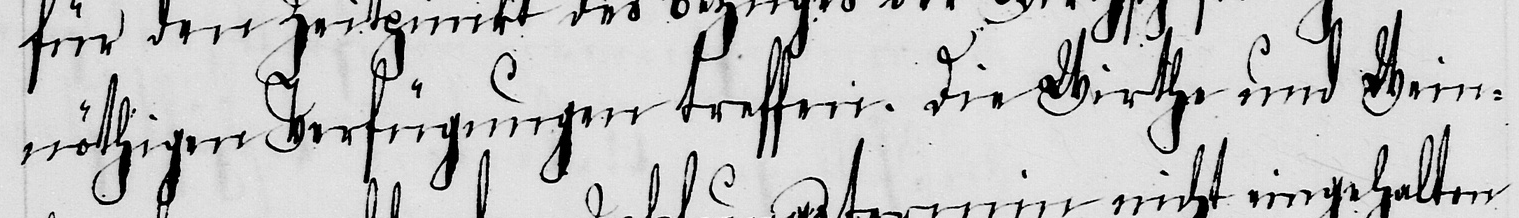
nöthigen Verfügungen treffen. Die Wirthe und Wein¬
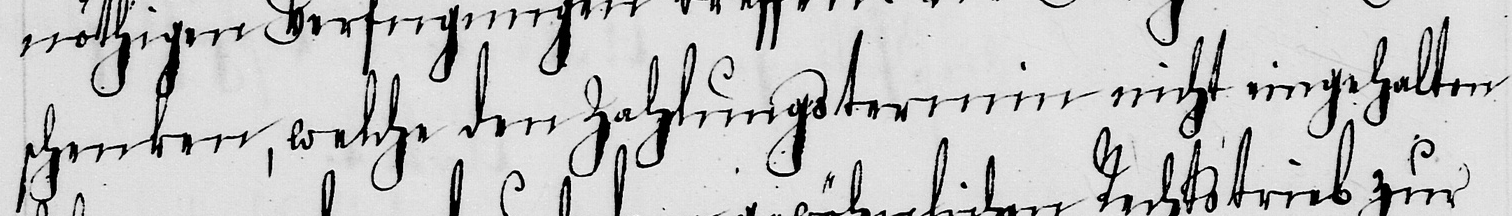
schenken, welche den Zahlungstermin nicht eingehalten
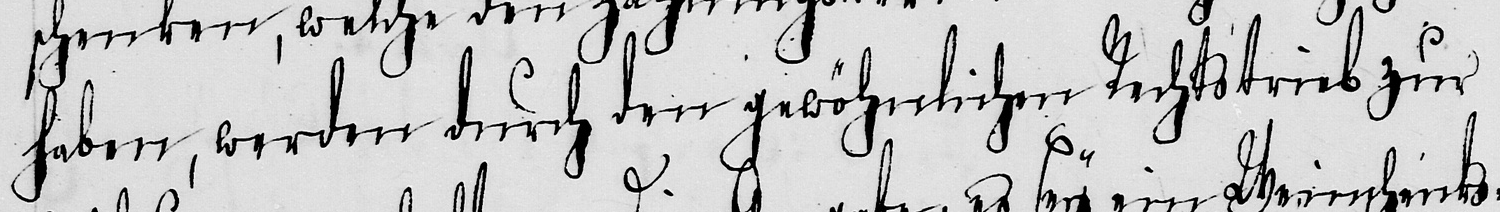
haben, werden durch den gewöhnlichen Rechtstrieb zur
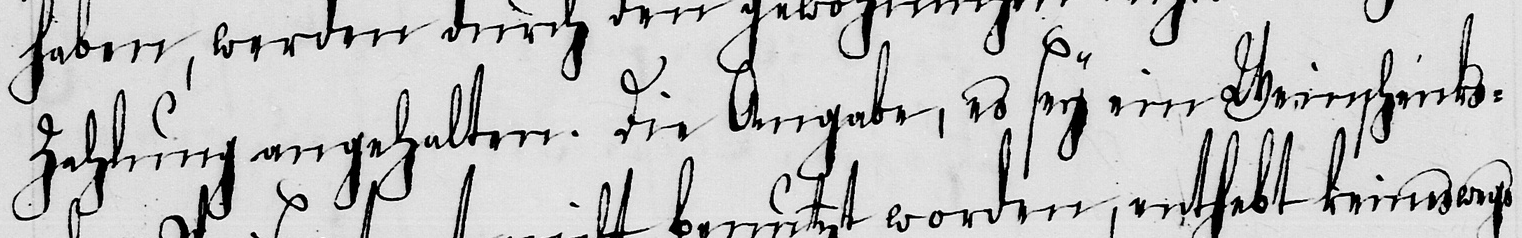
Zahlung angehalten. Die Angabe, es sey ein Weinschenks-
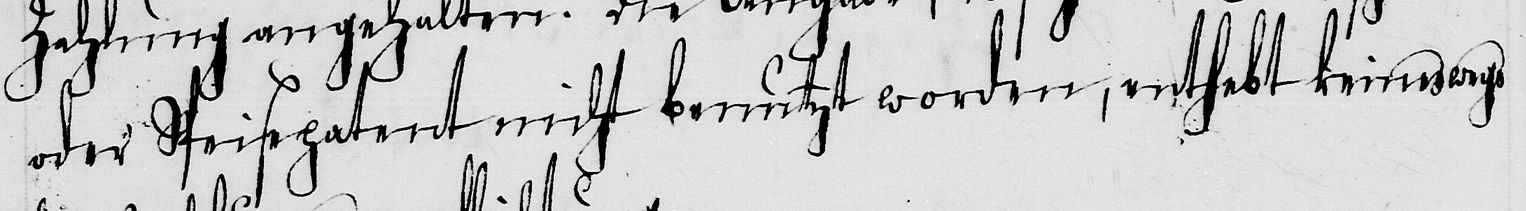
oder Speisepatent nicht benutzt worden, enthebt keineswegs
